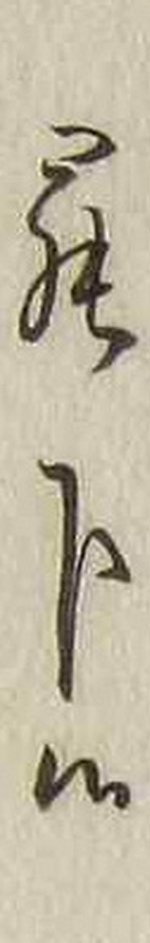罷下候
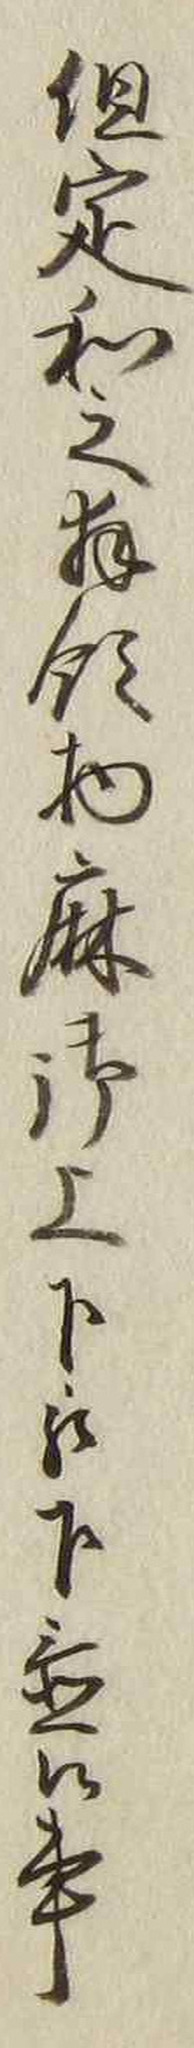但定和之拝領物麻御上下被下置候事

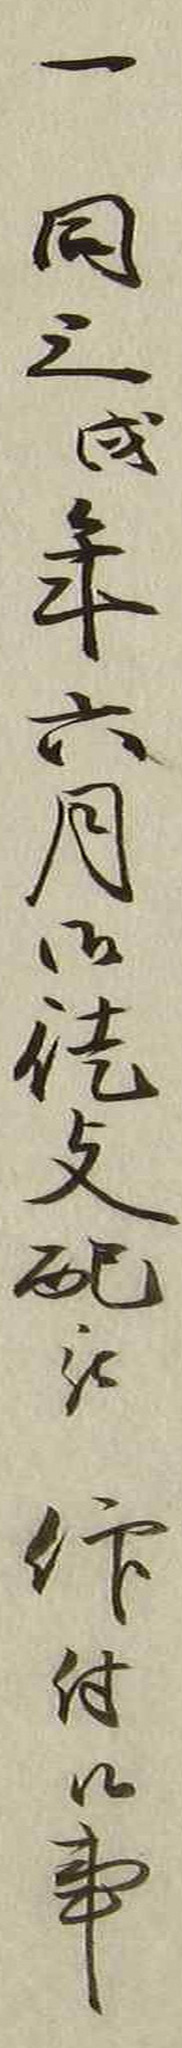一同三戌年六月御徒支配被仰付候事
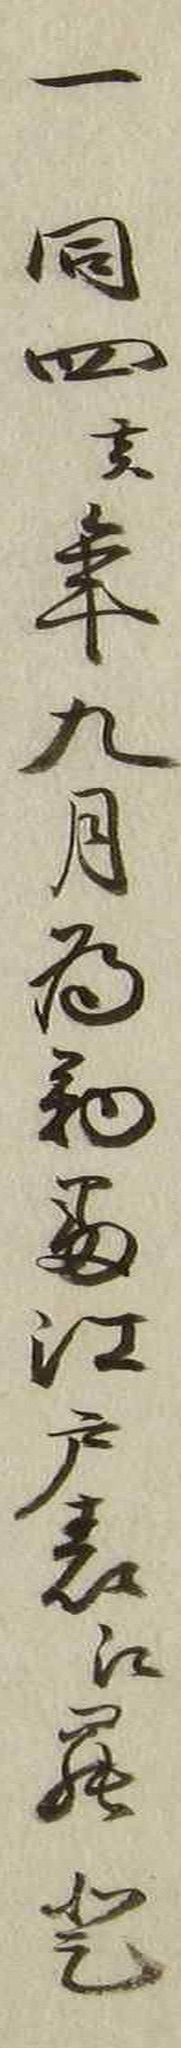一同四亥年九月為勤番江戸表江罷登
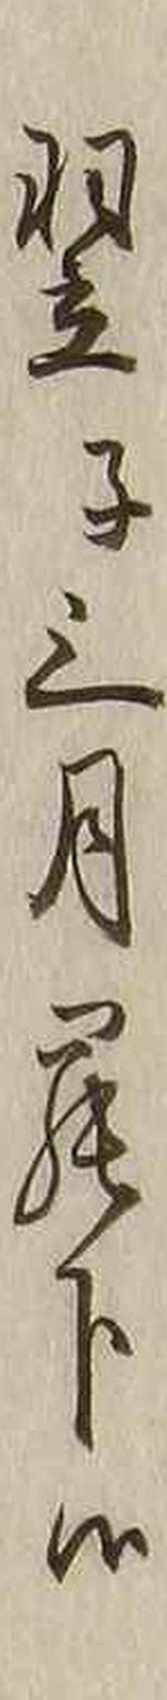翌子三月罷下候
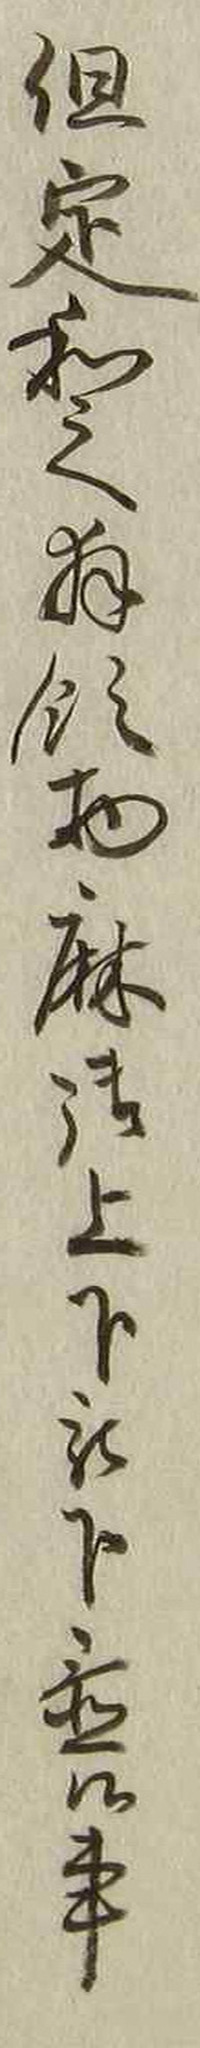但定和之拝領物麻御上下被下置候事
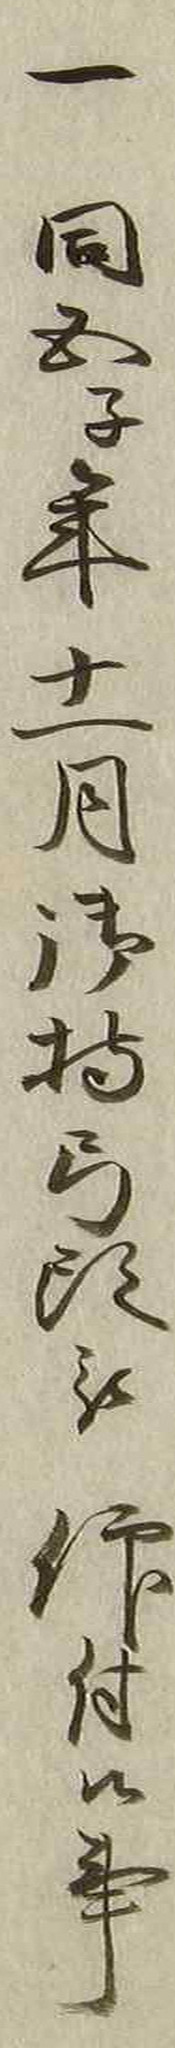一同五子年十一月御持弓頭被仰付候事
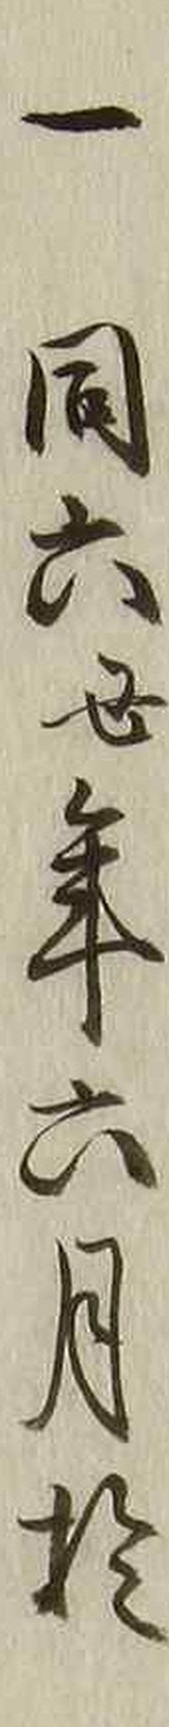一同六丑年六月於
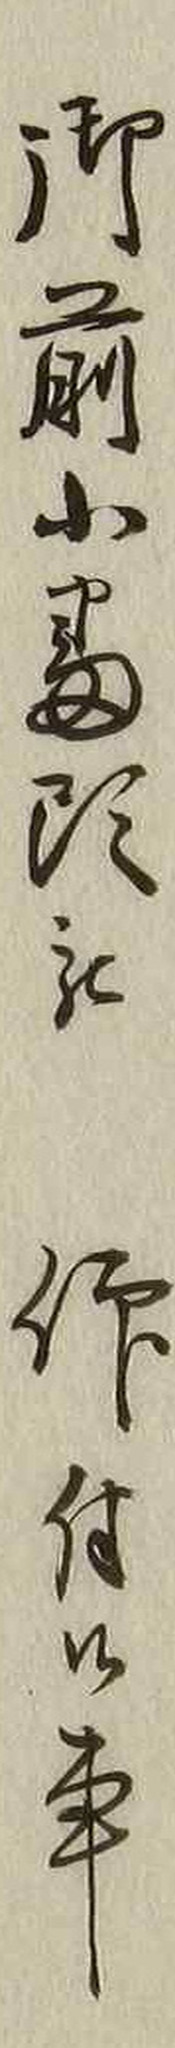御前小番頭被仰付候事
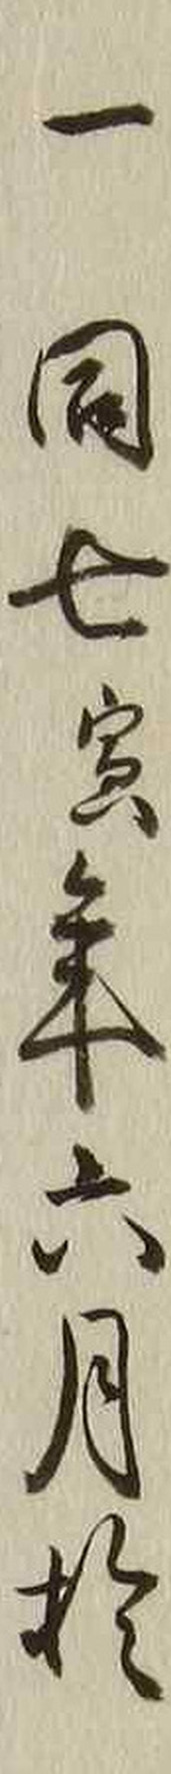一同七寅年六月於
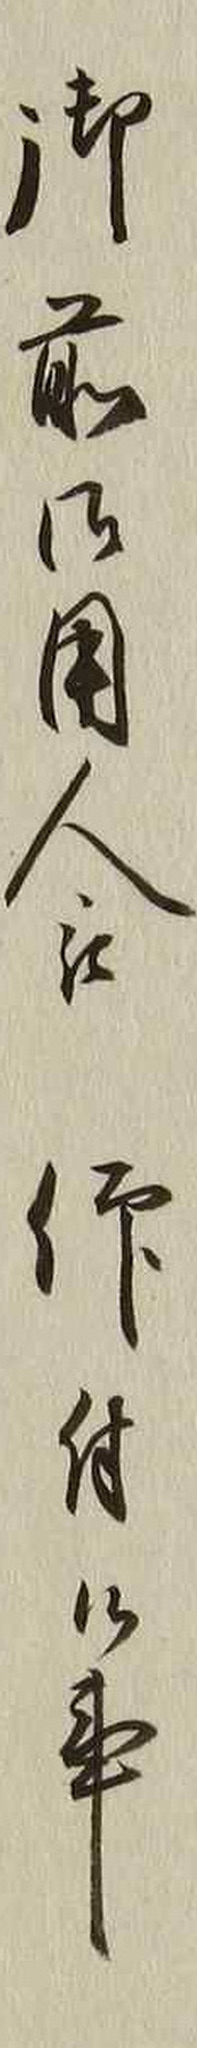御前御用人被仰付候事
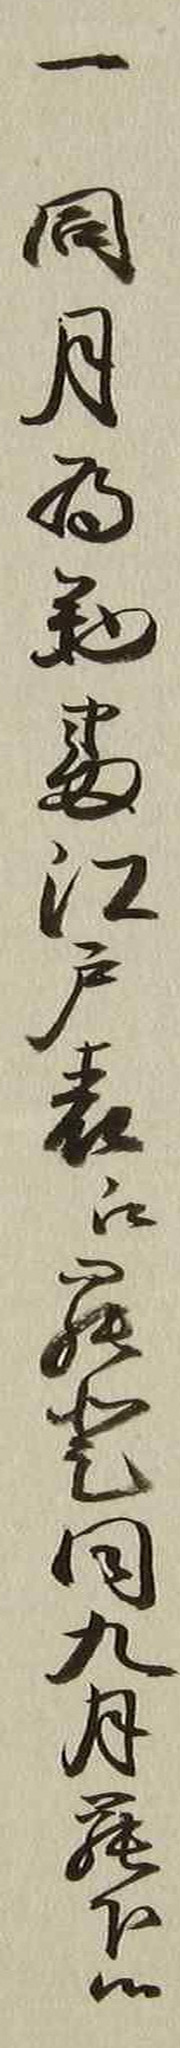一同月為勤番江戸表江罷登同九月罷下候
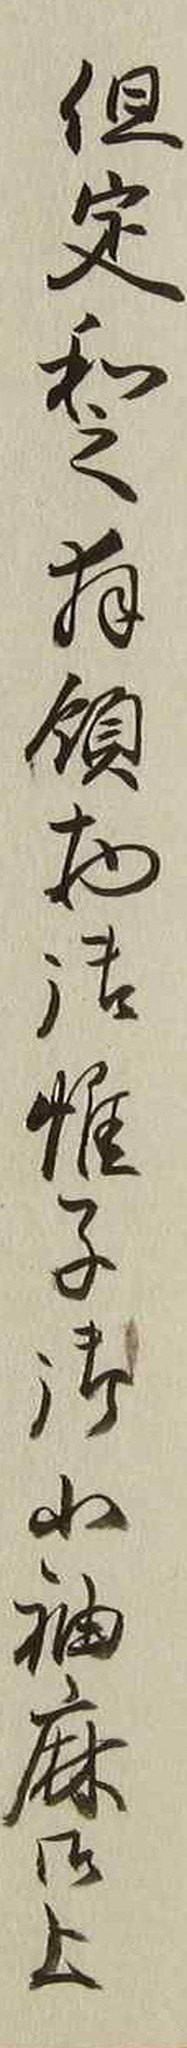但定和之拝領物御帷子御小袖麻御上
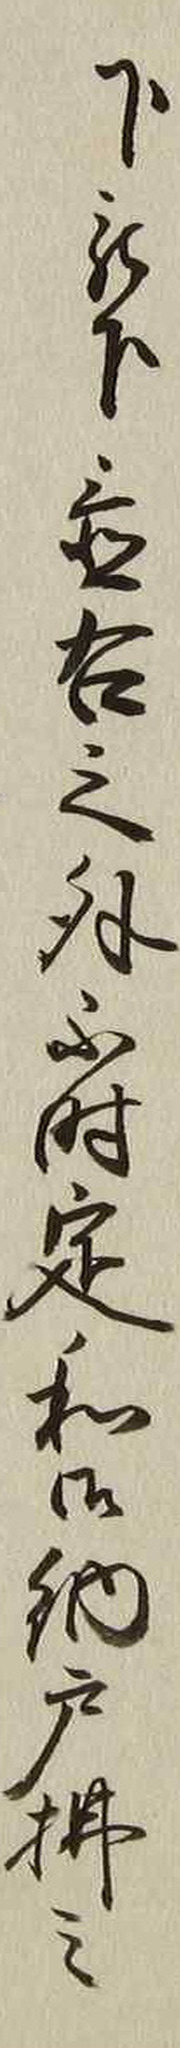下被下置右之外不時定和御納戸払之
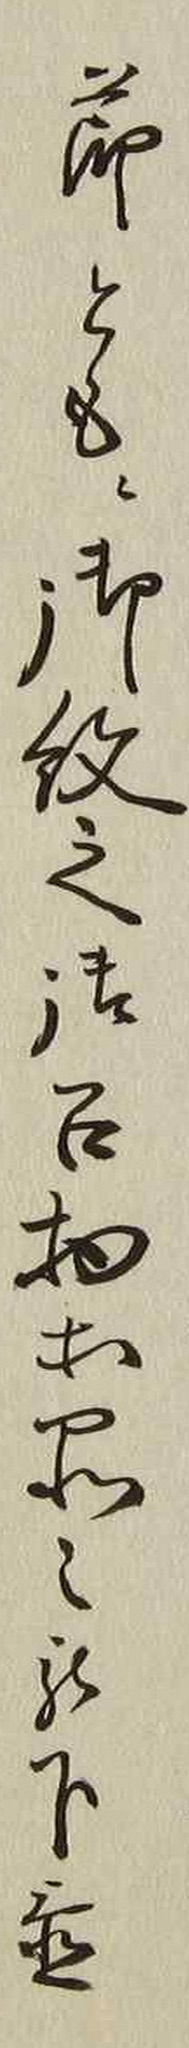節ともニ御紋之御召物等品々被下置
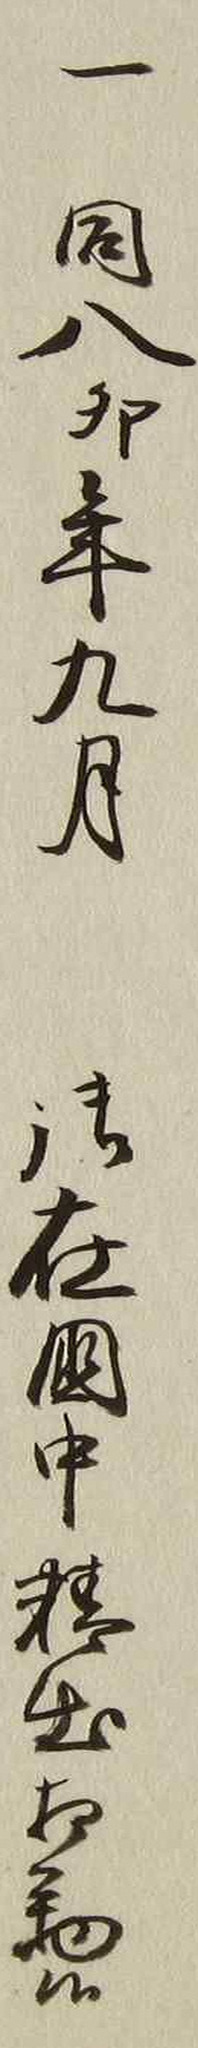一同八卯年九月御在国中精出相勤候
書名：諸士系譜　巻之15　い之部15
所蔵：会津若松市立会津図書館
